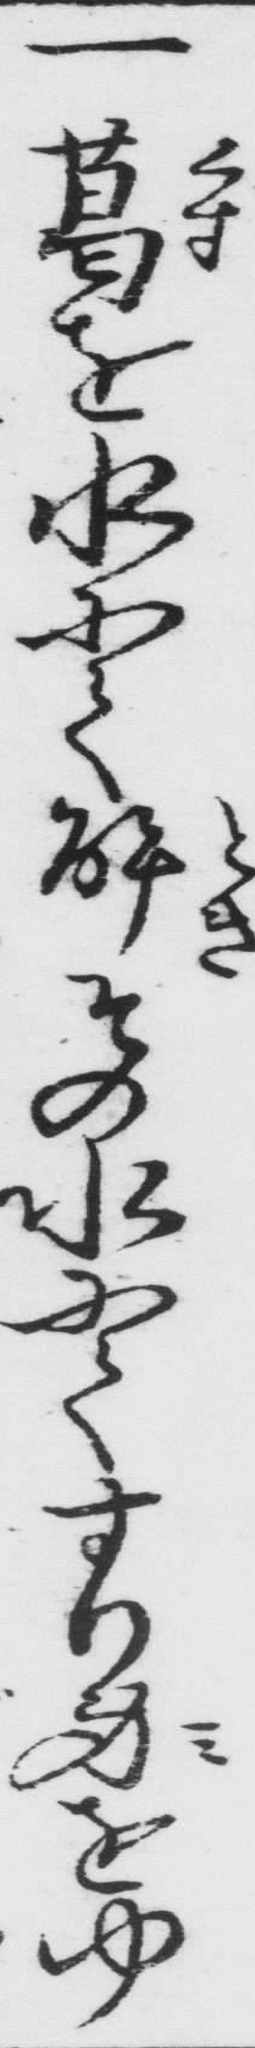一葛を水にて解その水にてすり身をゆ
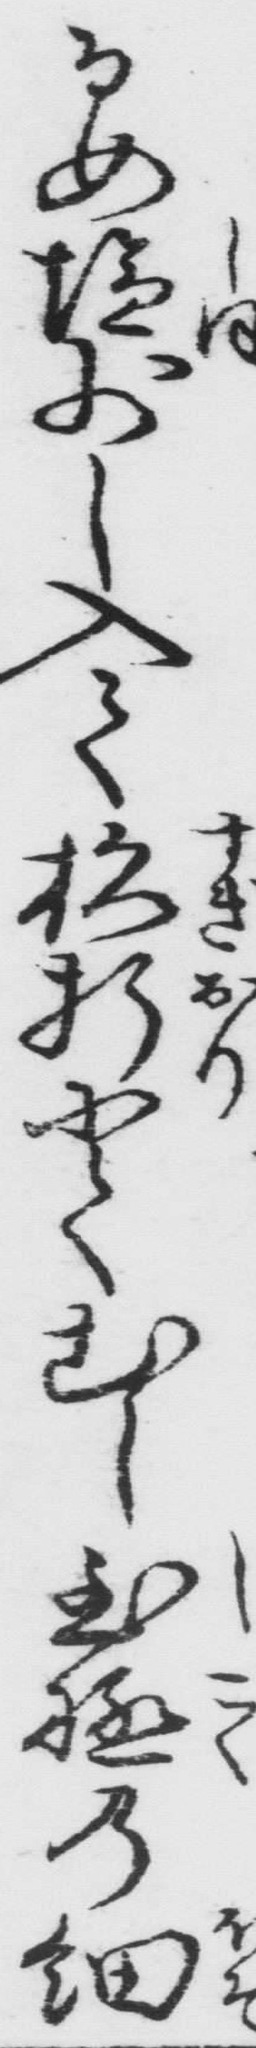るめ塩少し入て杦折にてむし至極の細
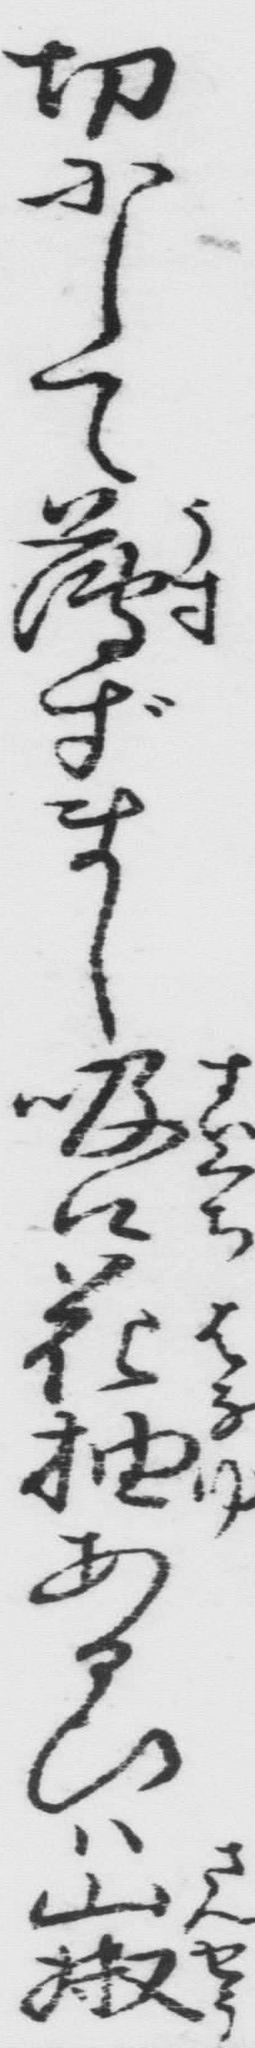切にして薄ずまし吸口花柚あるひは山椒
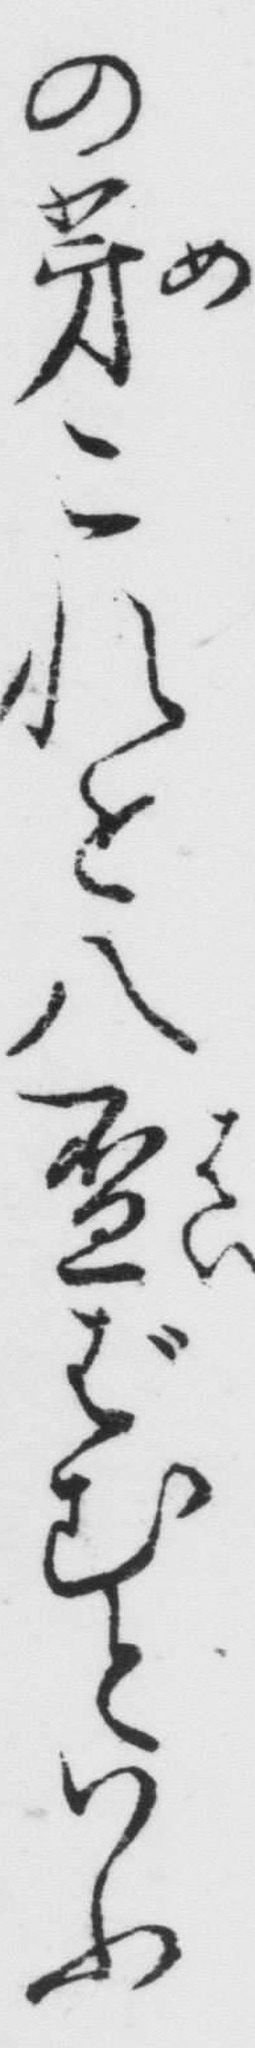の芽これを八盃ばむといふ
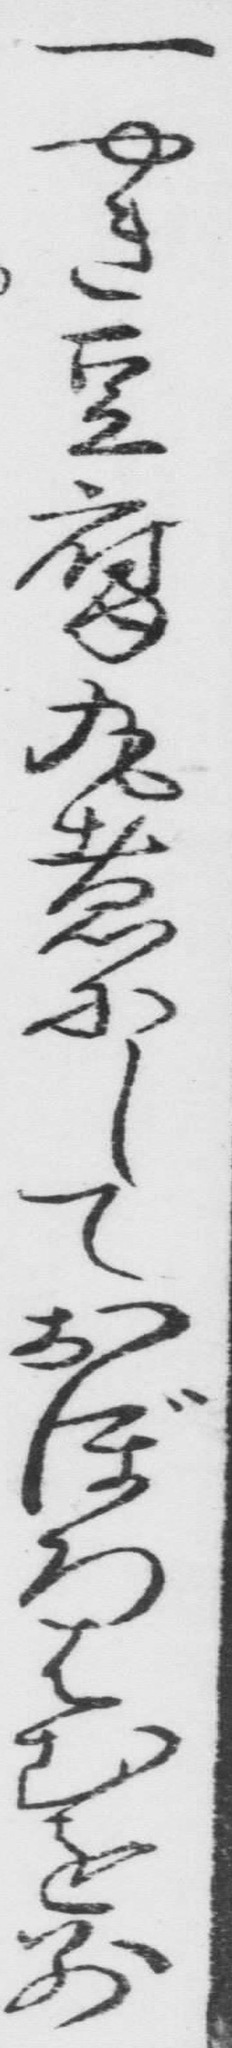一やき豆腐丸煮にしておぼろはむを別
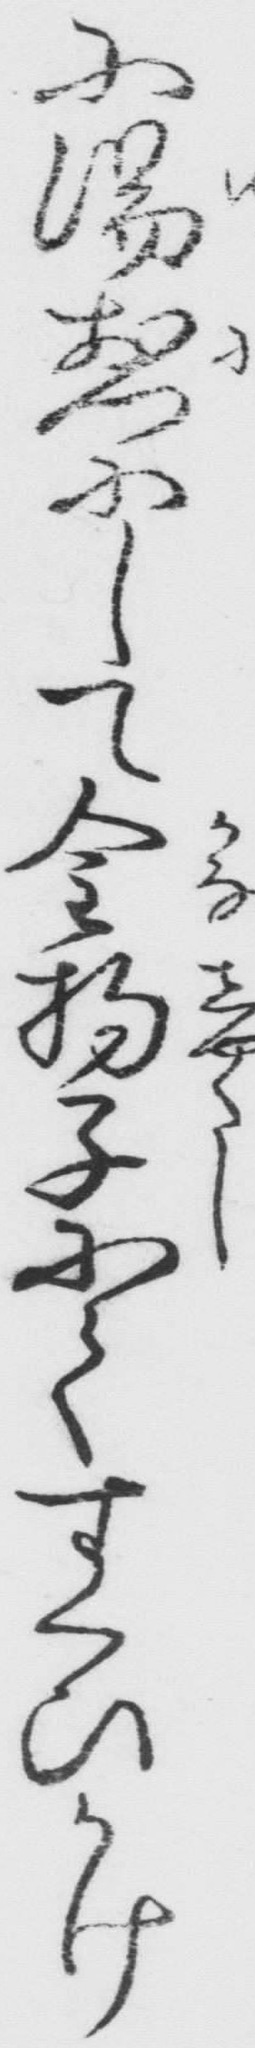に湯煮にして金杓子にてすくひかけ
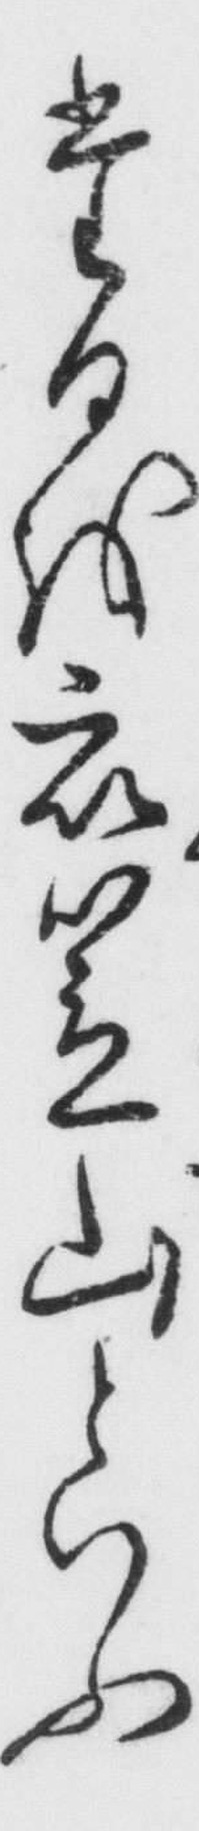たるを衣笠山といふ
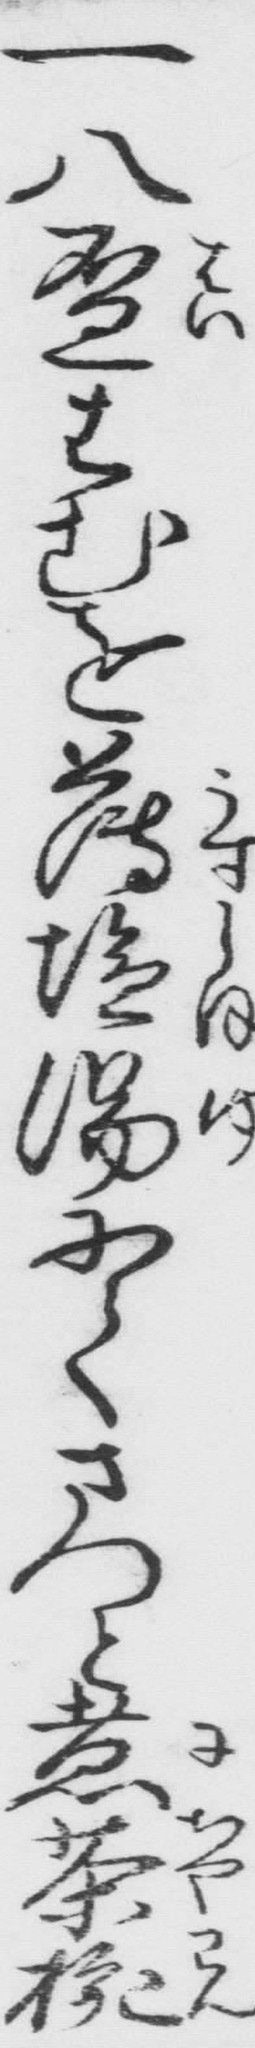一八盃はむを薄塩湯にてさつと煮茶椀
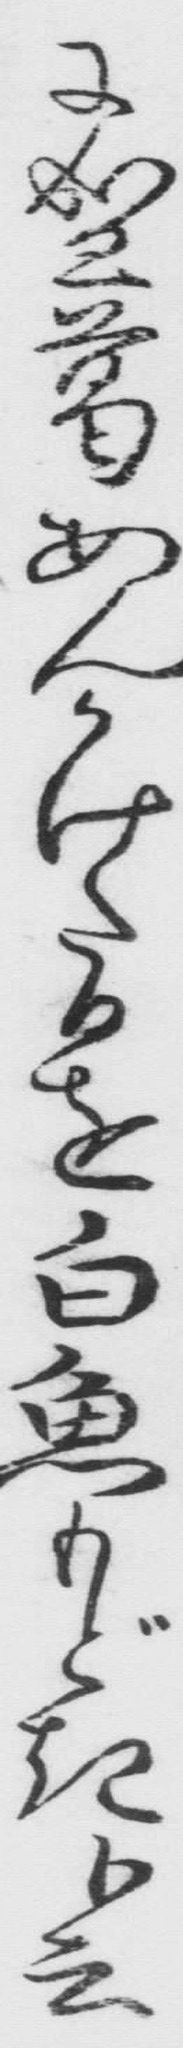に盛葛あんかけたるを白魚もどきと云
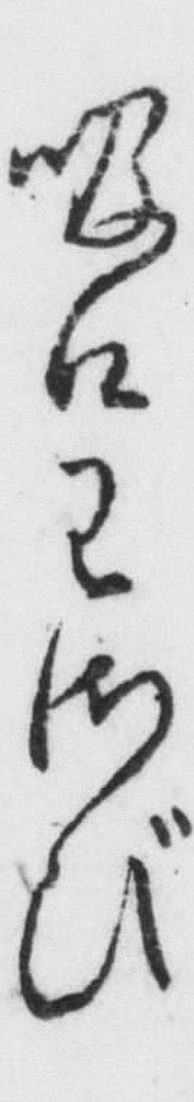吸口わさび
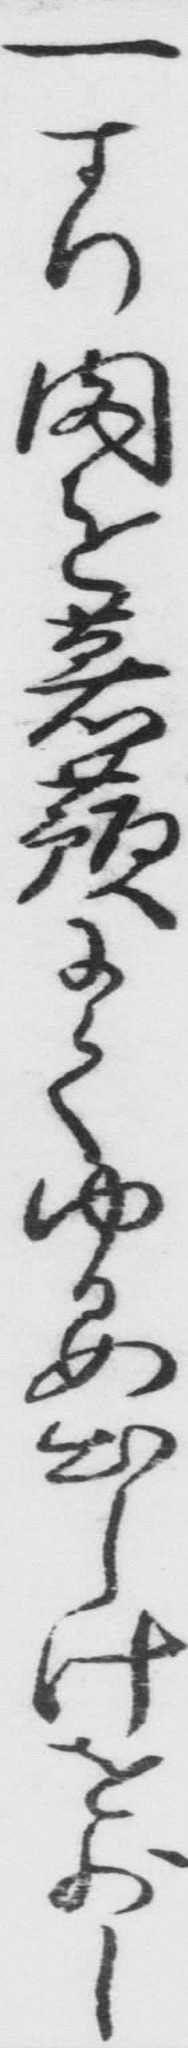一すり肉を薯蕷にてゆるめ出し汁を少し

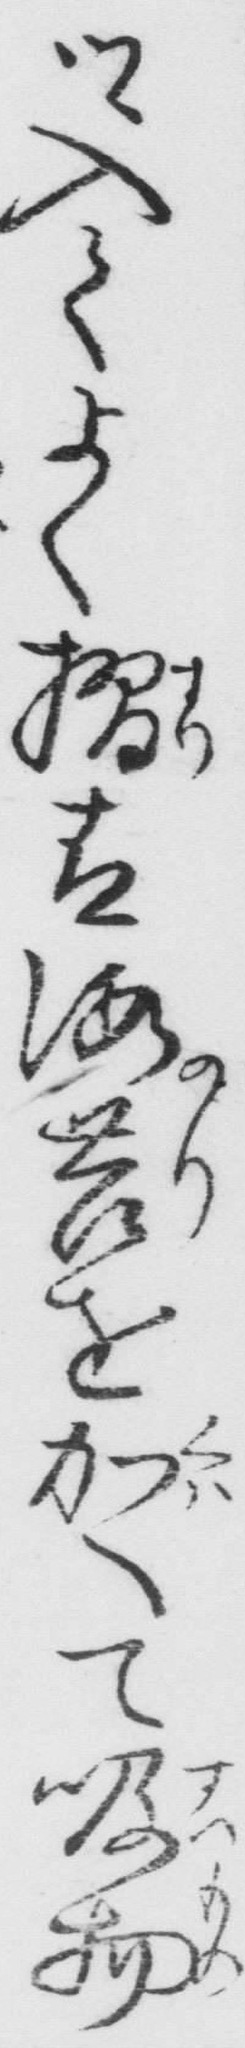ツヽ入てよく摺青海苔を加へて吸物
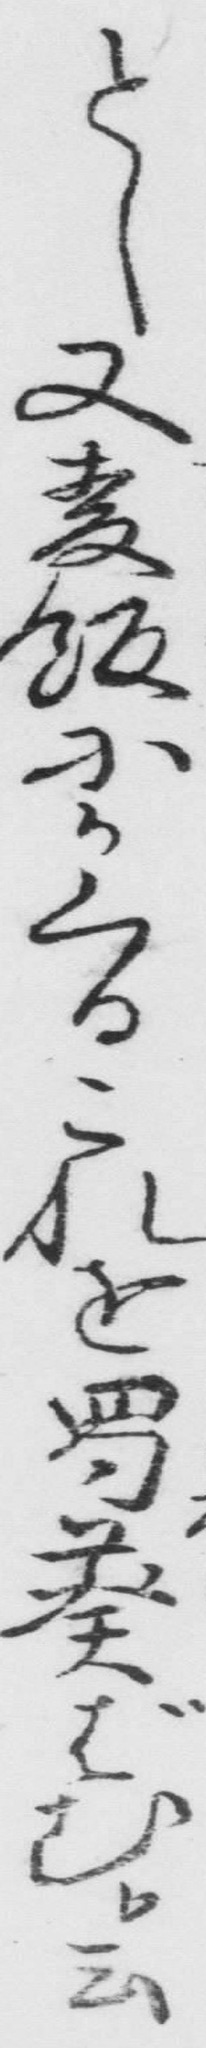とし又麦飯にかくるこれを蜀葵ばむと云
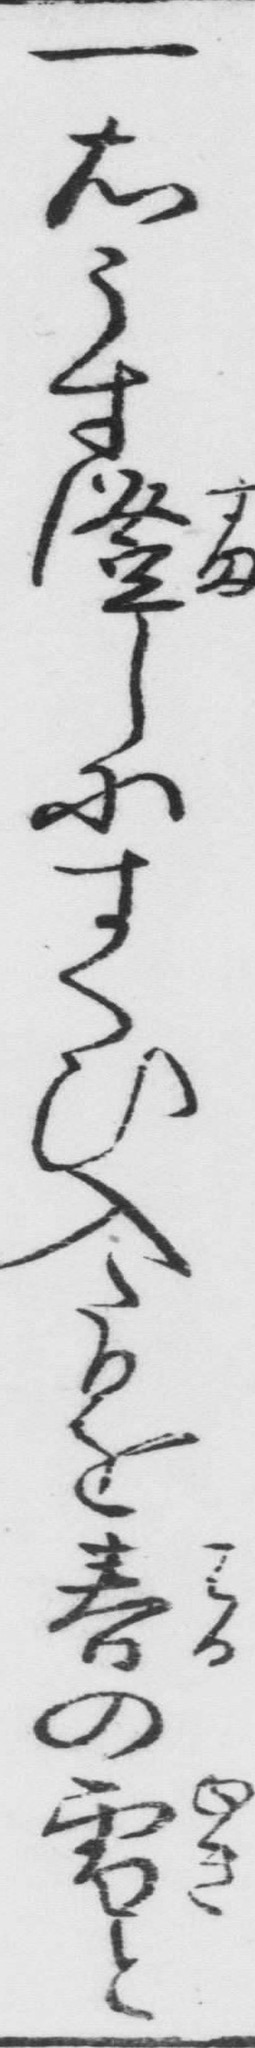一右うす澄しにすくひ入たるを春の雪と
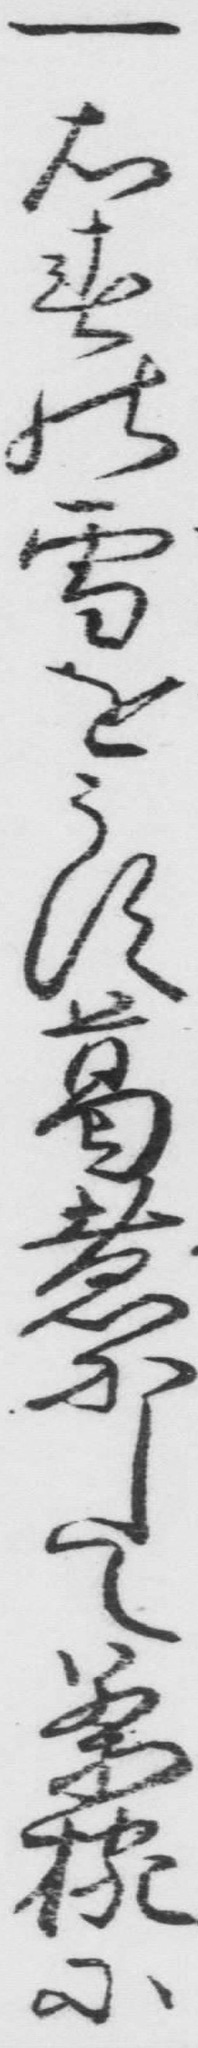一右春の雪をうす葛煮にして茶椀に
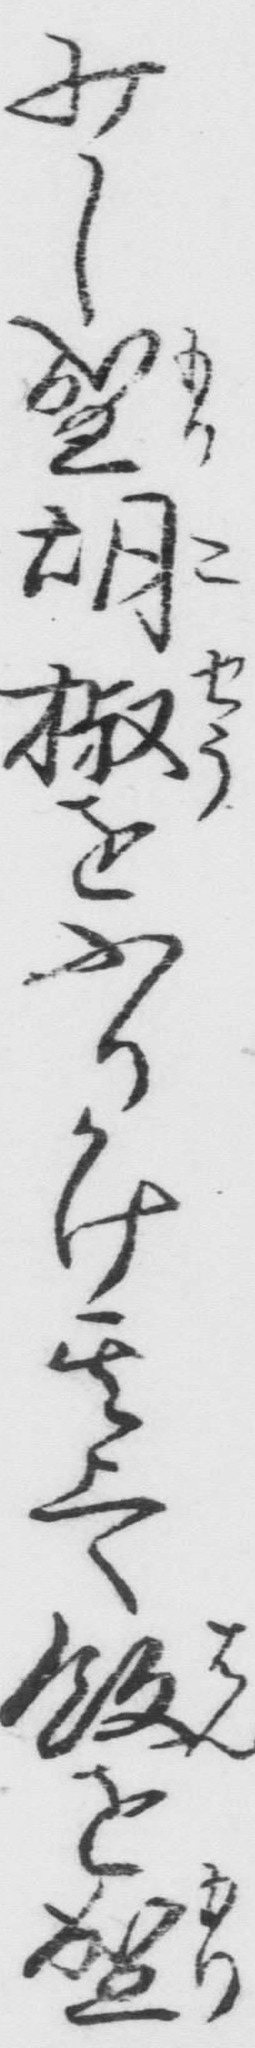少し盛胡椒をふりかけ其上へ飯を盛
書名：海鰻百珍
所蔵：大阪府立大学学術情報センター 国文学研究資料館
